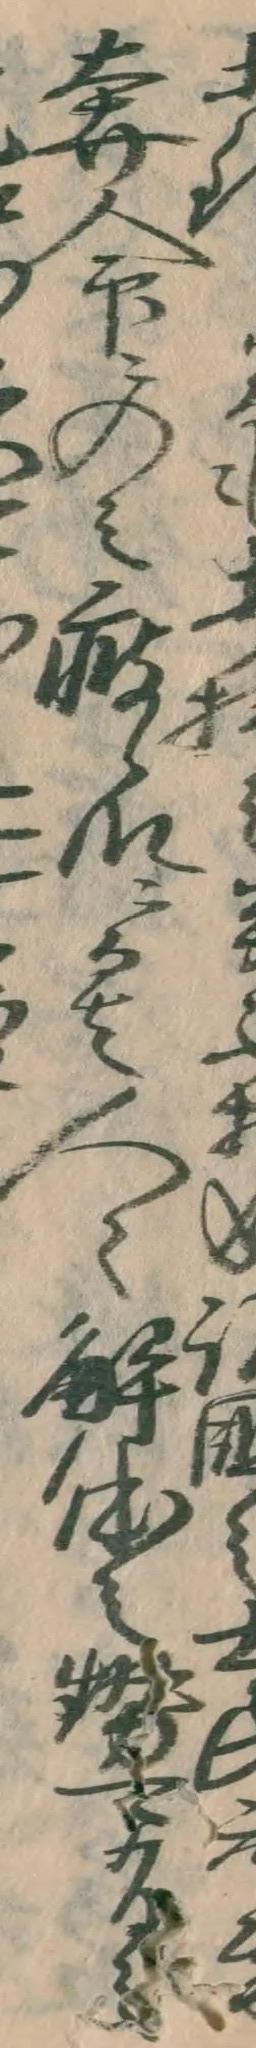奔命ニのミ疲候様ニ而者人々解体之勢可有之
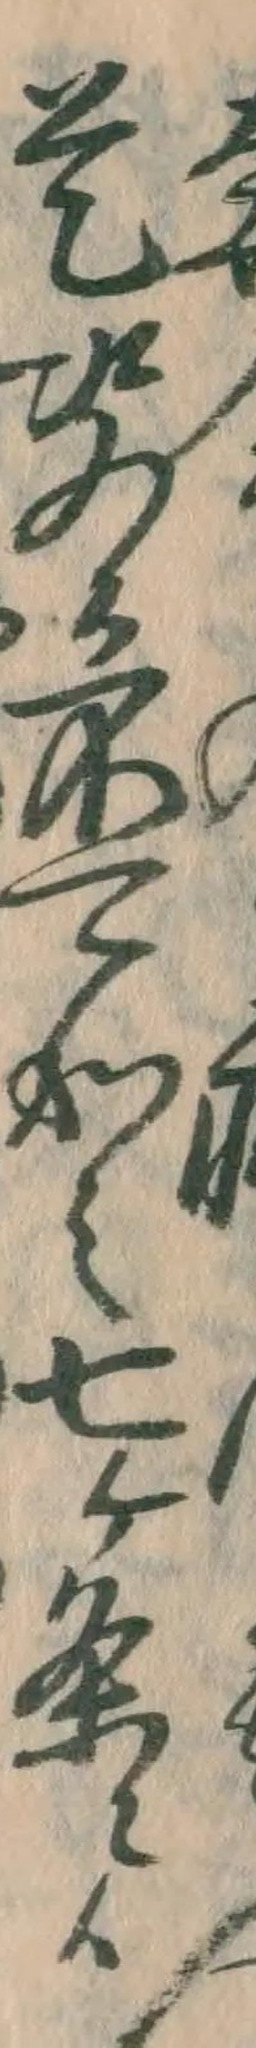是決而不可和之七ケ条ニ候
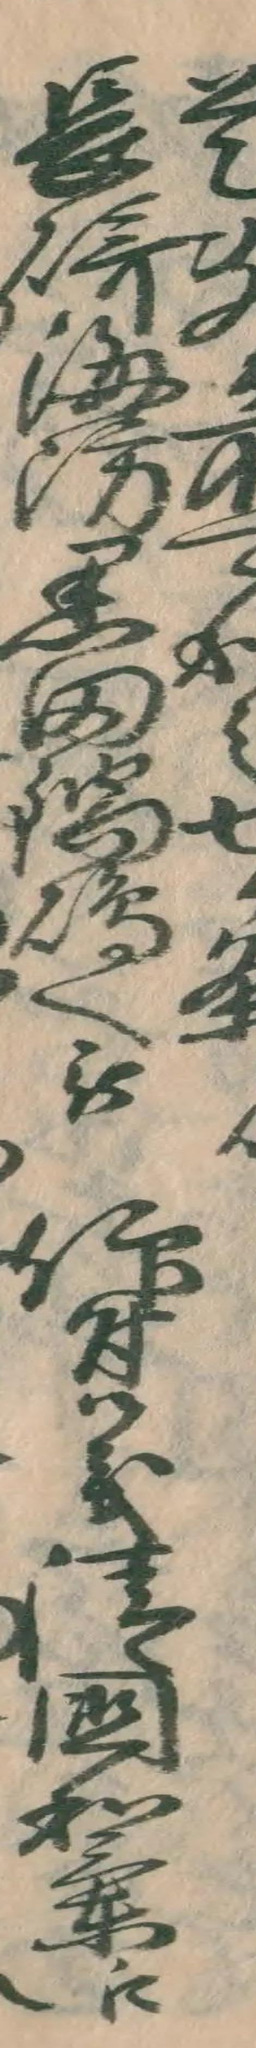一長崎海防黒田鍋嶋へ被仰付候義清国和蘭江
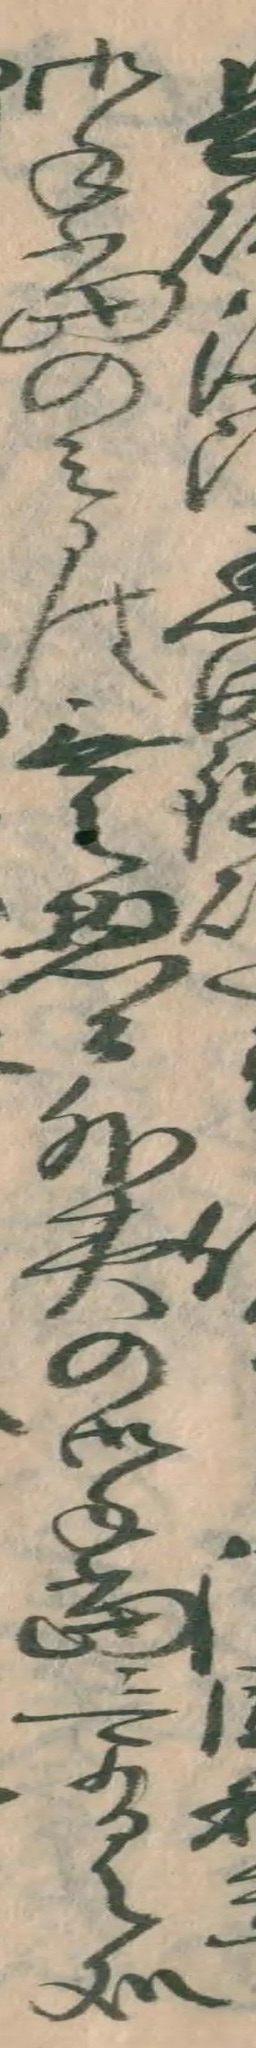御手當のミには無之惣而外夷の御手當ニ可有之処
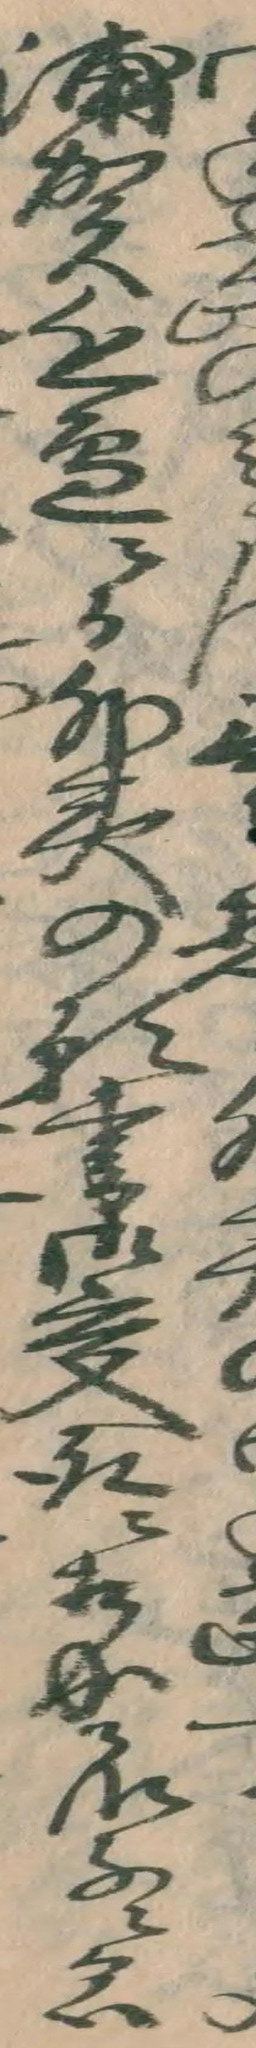浦賀近邊ニ而外夷の願書御受取ニ相成候様子ニ而ハ
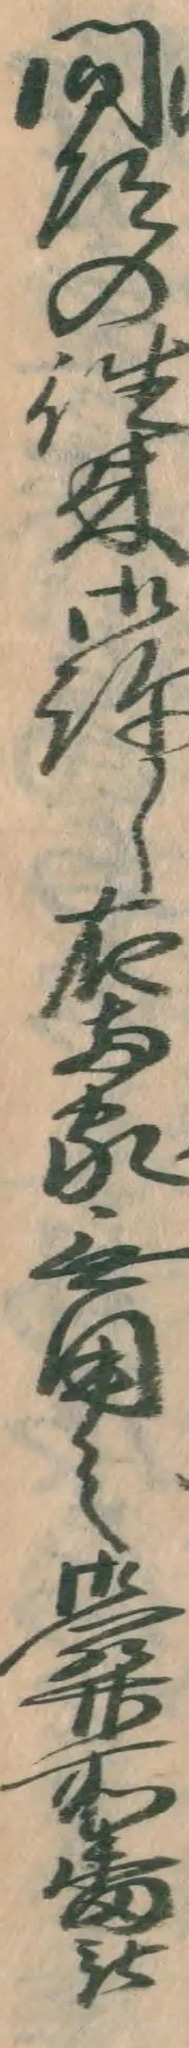間道の往来御許し右両家無用之御関所番被

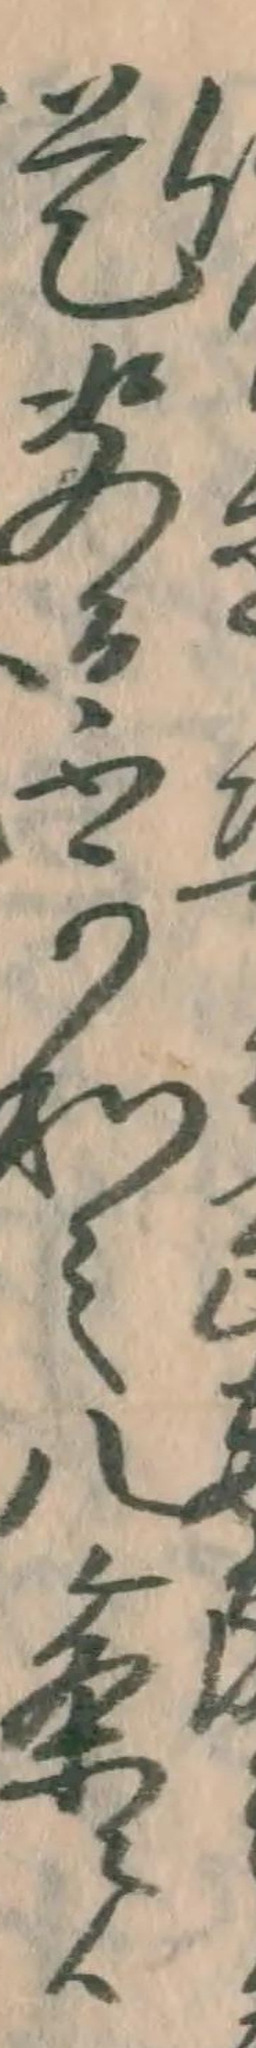是決而不可和之八ケ条ニ候
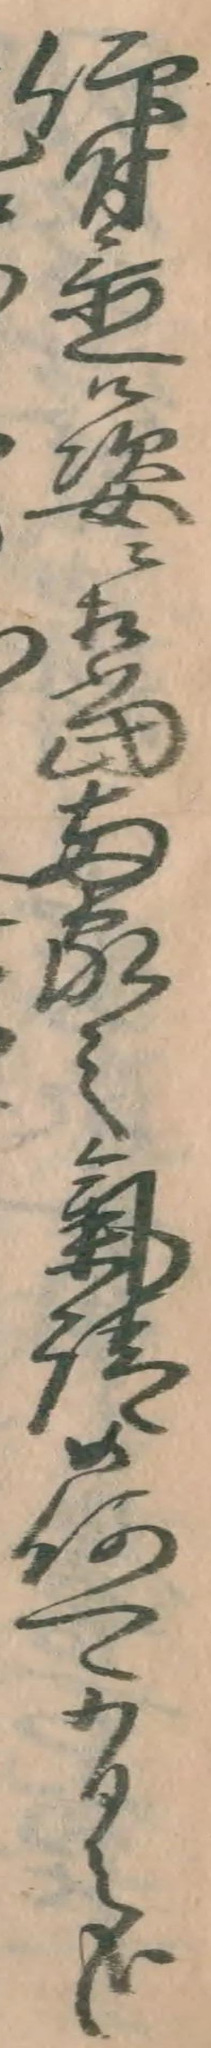仰付置候姿ニ相當両家之氣請如何可有之哉
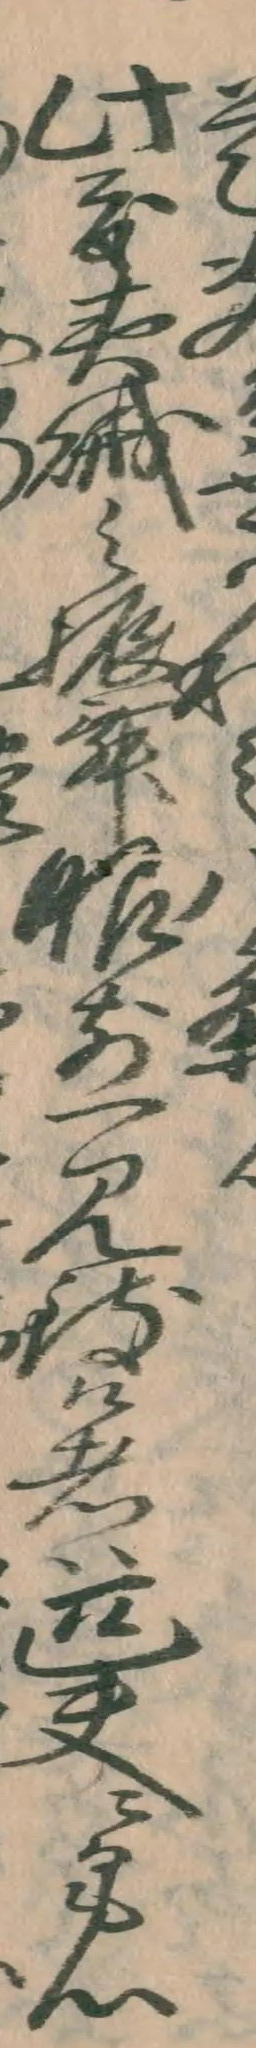一此度夷賊之振舞眼前一見致候者ハ匹夫ニ而も心
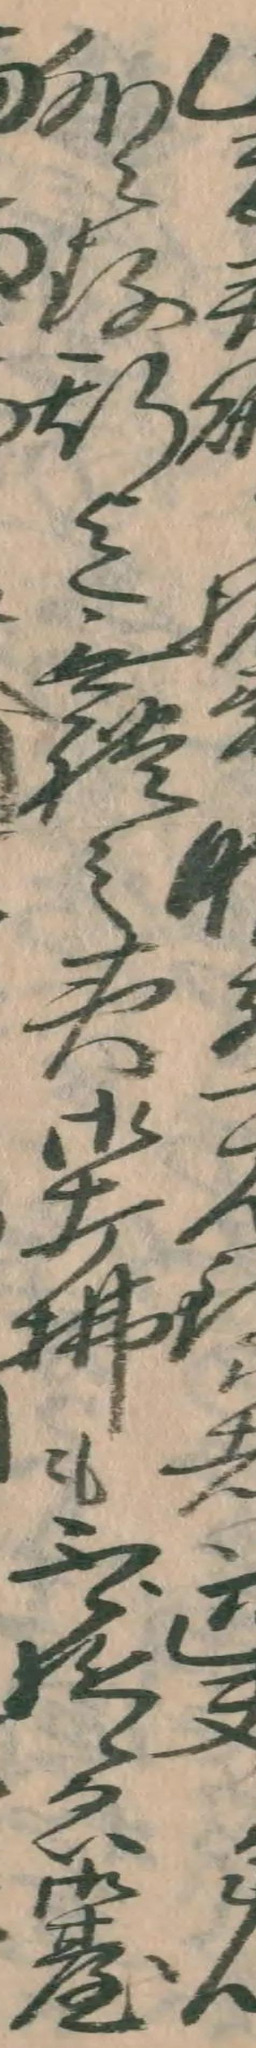外ニ存斯迄無禮之夷御打拂も不被遊候而ハ御臺
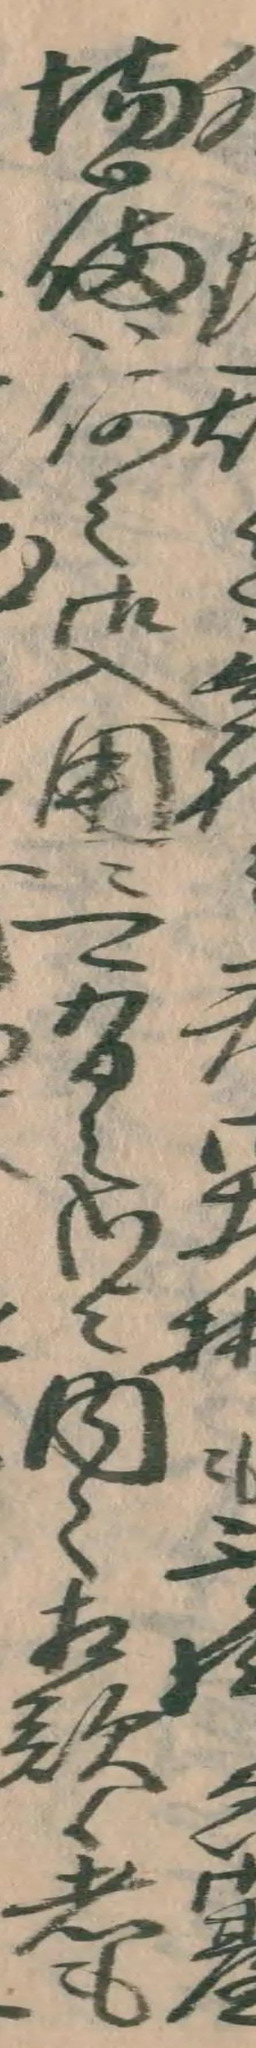場御備ハ何之御入用ニ可有之哉と内々相歎候者も
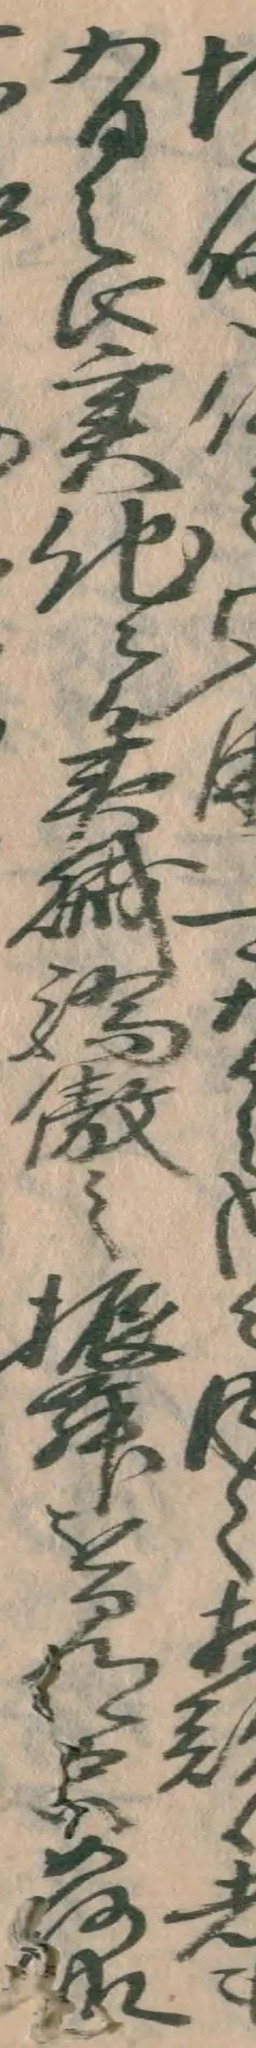有之由実地ニ而夷賊驕傲之振舞を見候而ハ如何様
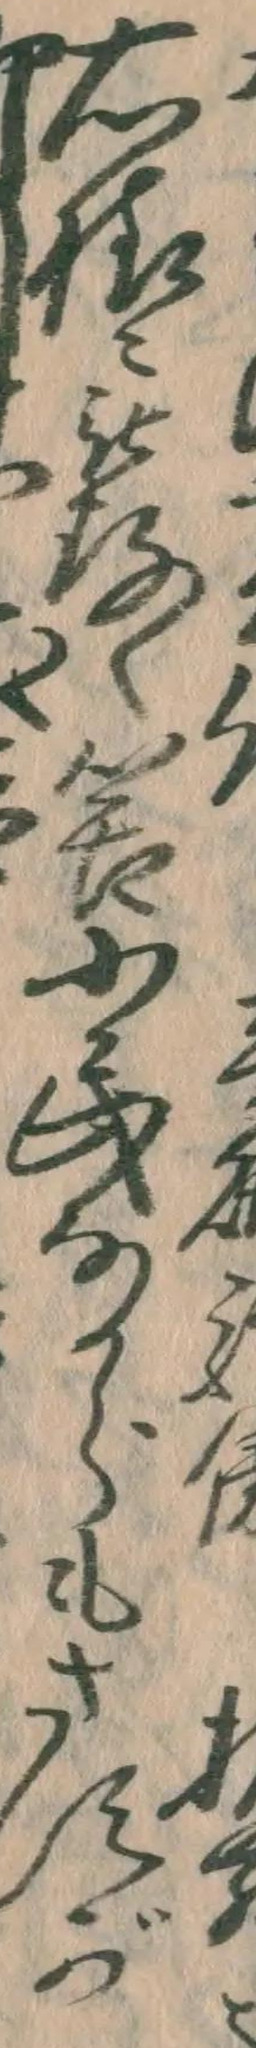右様ニ被存候筈小民なからもさすが
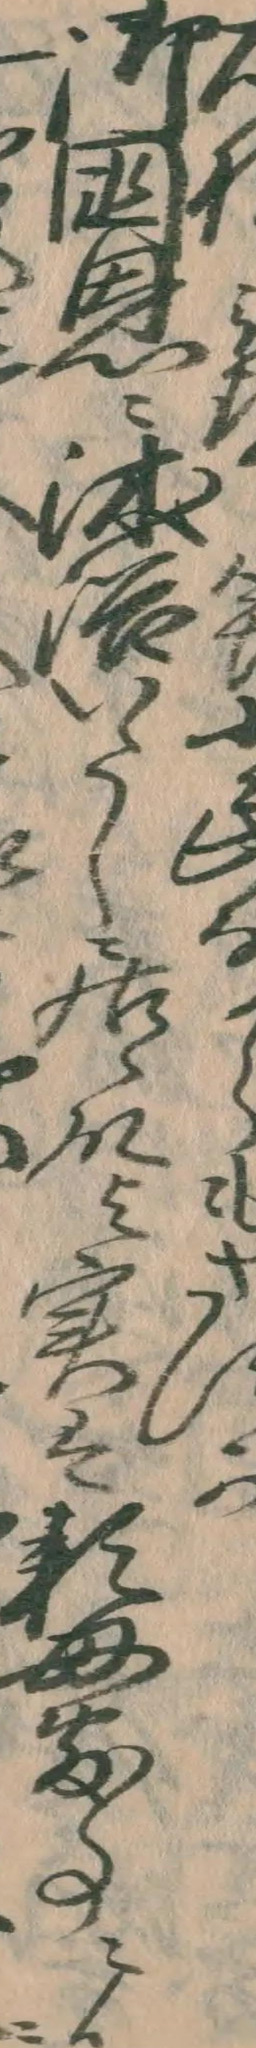御國恩ニ沐浴いたし居候様と実者頼母敷事ニ候
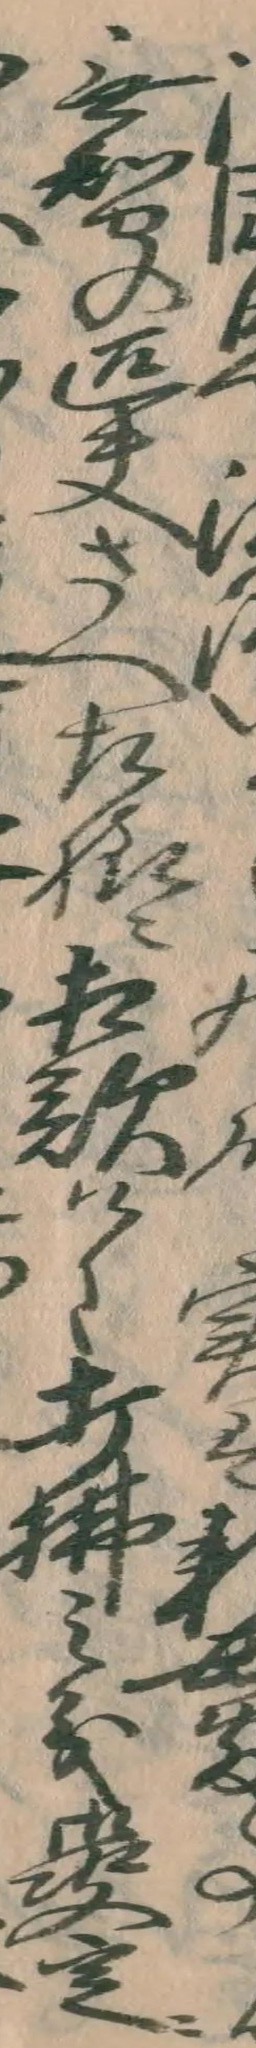無智の匹夫さへ左様ニ相歎候に打拂之義御決定ニ
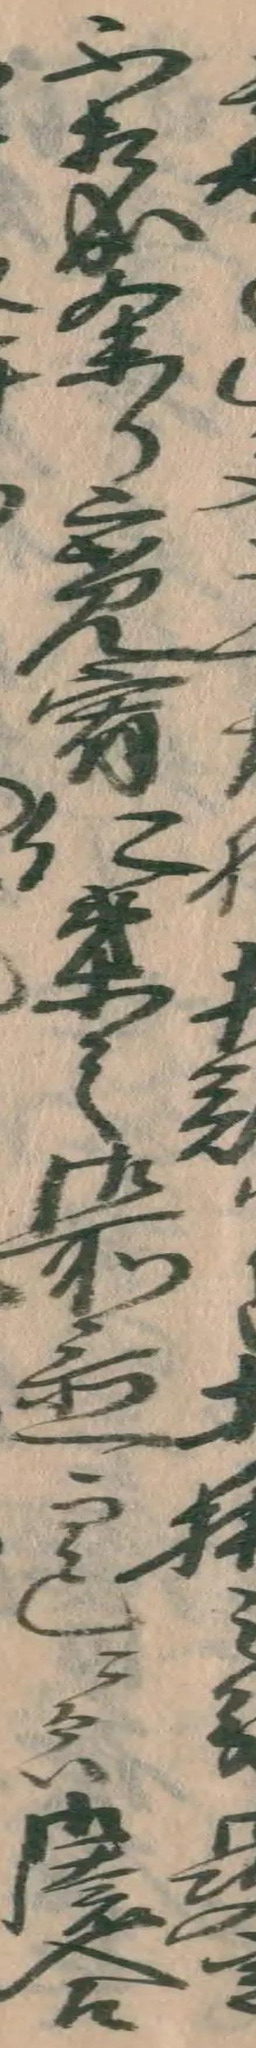不相成余り寛宥仁柔之御所置而已ニ而ハ御懐合
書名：麗斎叢書. 20
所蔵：国立国会図書館 National Diet Library, JAPAN
